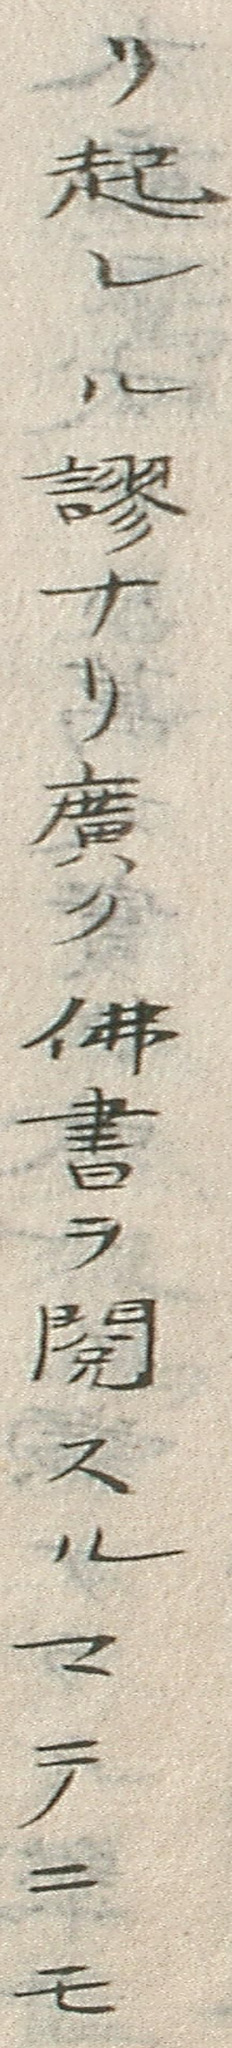リ起レル謬ナリ広ク仏書ヲ閲スルマテニモ
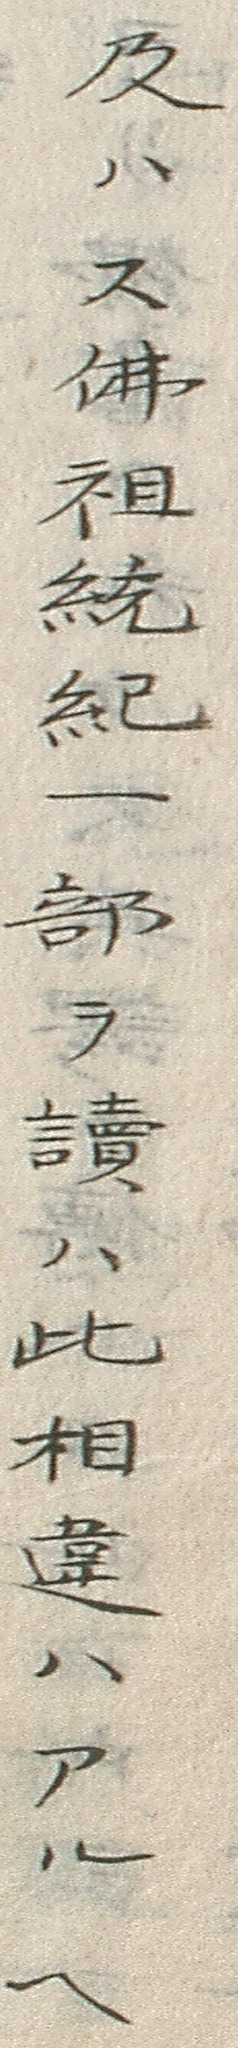及ハス仏視統紀一部ヲ読ハ此相違ハアルヘ
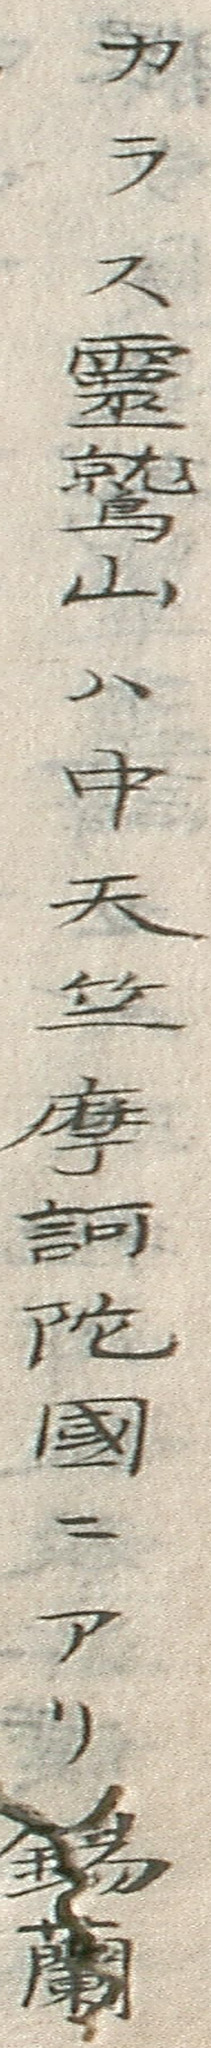カラス霊鷲山ハ中天竺摩訶陀国ニアリ錫蘭
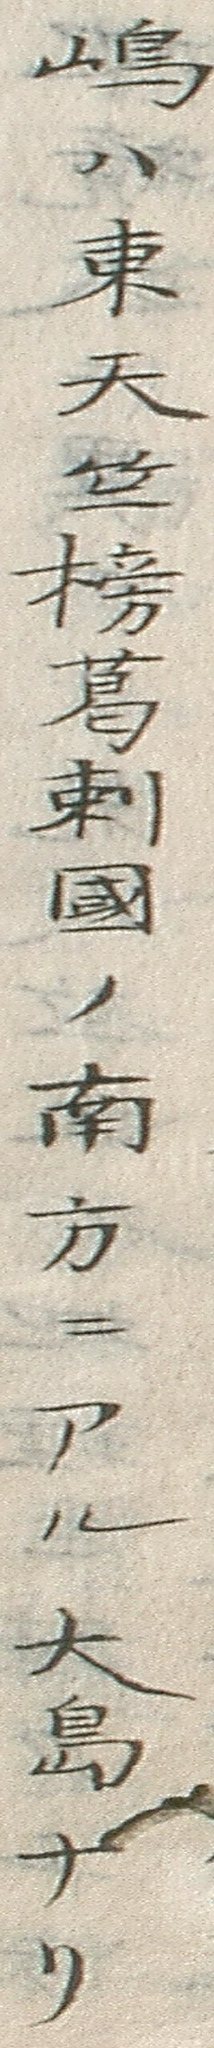嶋ハ東天竺榜葛刺国ノ南方ニアル大島ナリ

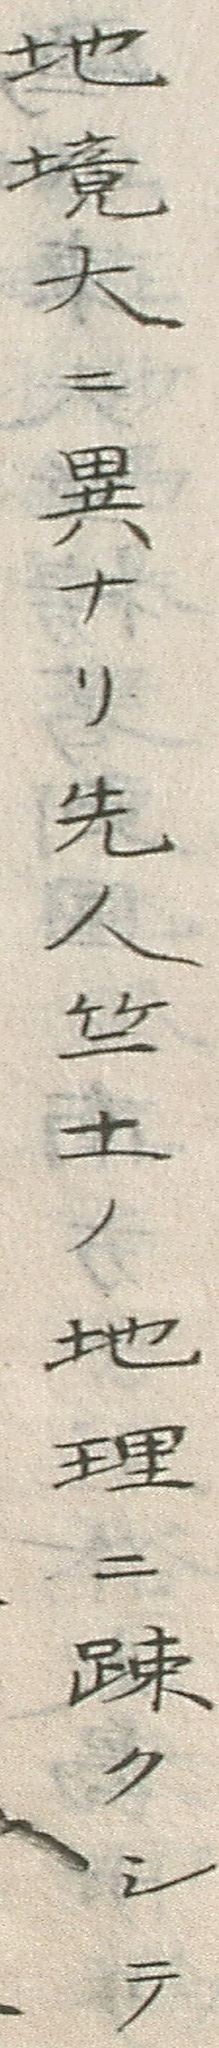地境大ニ異ナリ先人竺土ノ地理ニ疎クシテ
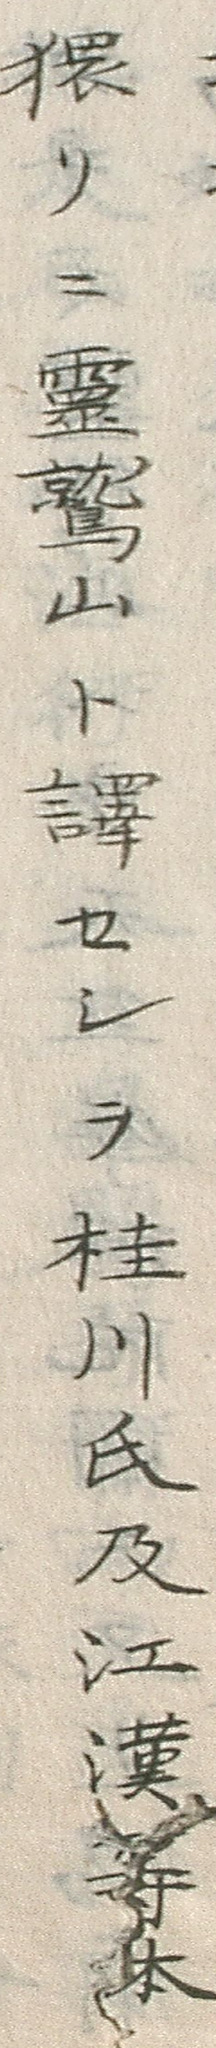猥リニ霊鷲山ト訳セシヲ桂川氏及江漢等本
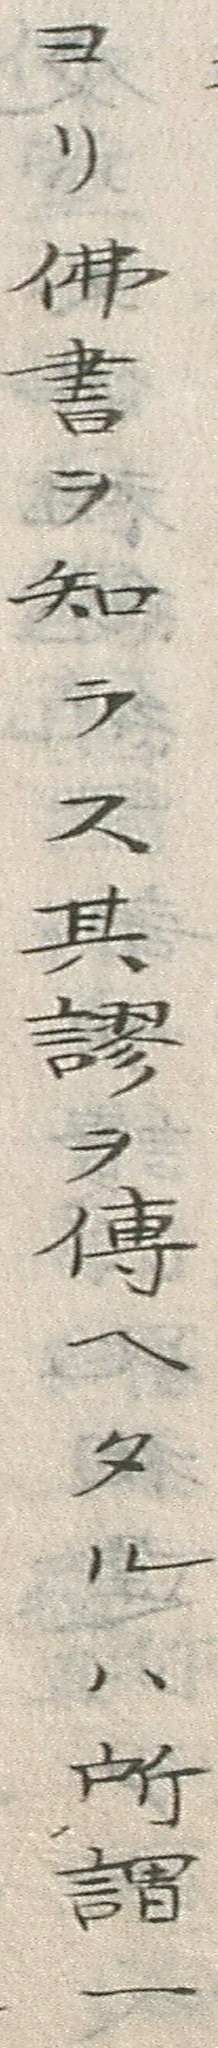ヨリ仏書ヲ知ラス其謬ヲ伝ヘタルハ所謂一
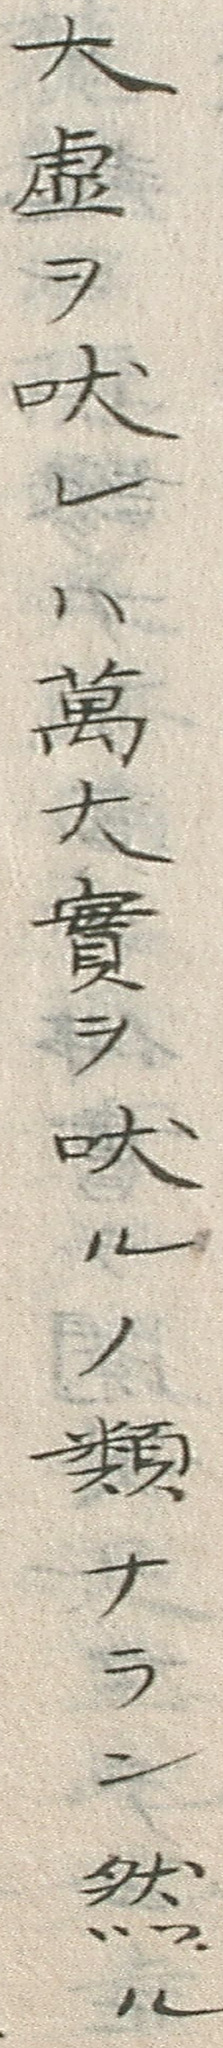大虚ヲ吠レハ万大実ヲ吠ルノ類ナラン然ル
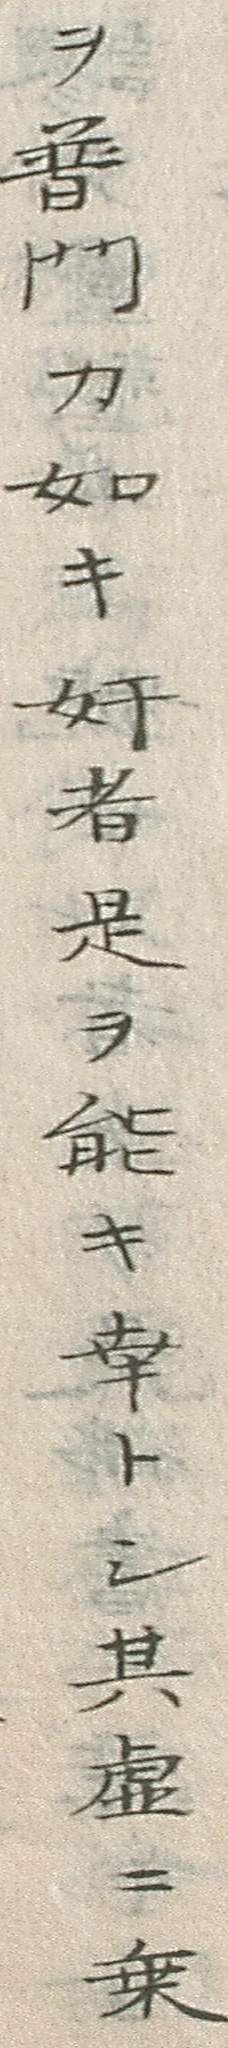ヲ普門カ如キ奸者是ヲ能キ幸トシ其虚ニ乗
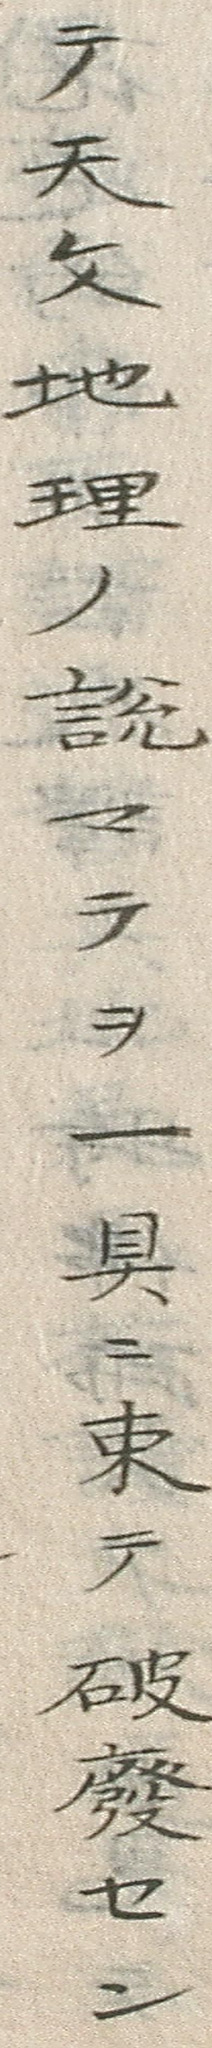テ天文地理ノ説マテヲ一具ニ束テ破廃セン
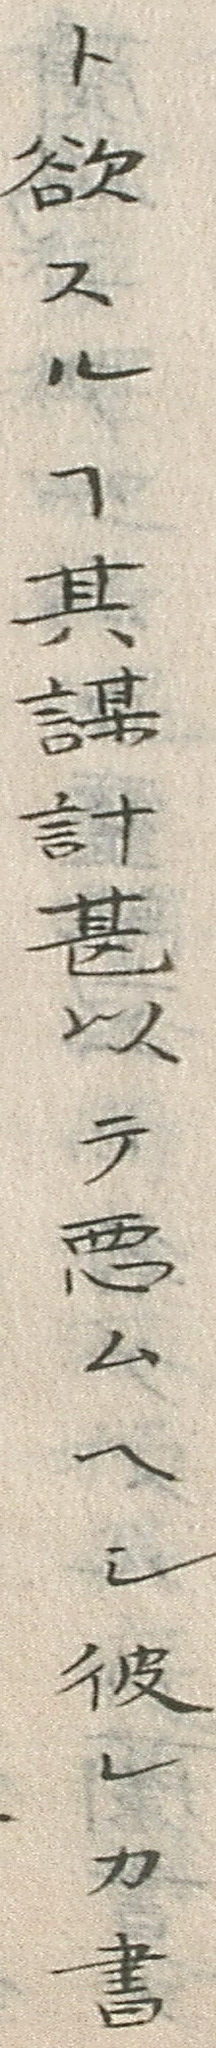ト欲スルコト其謀計甚以テ悪ムヘシ彼レカ書
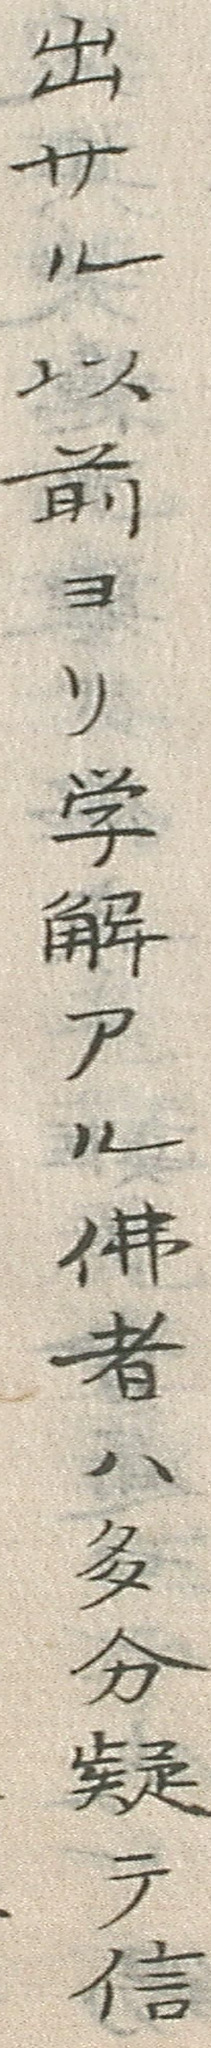出サル以前ヨリ学解アル仏者ハ多分疑テ信
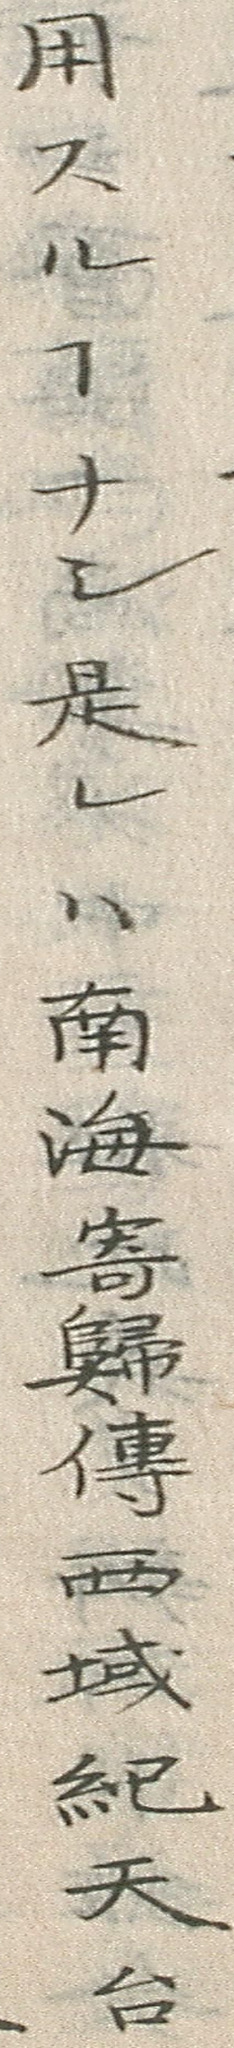用スルコトナシ是レハ南海寄帰伝西域紀天台
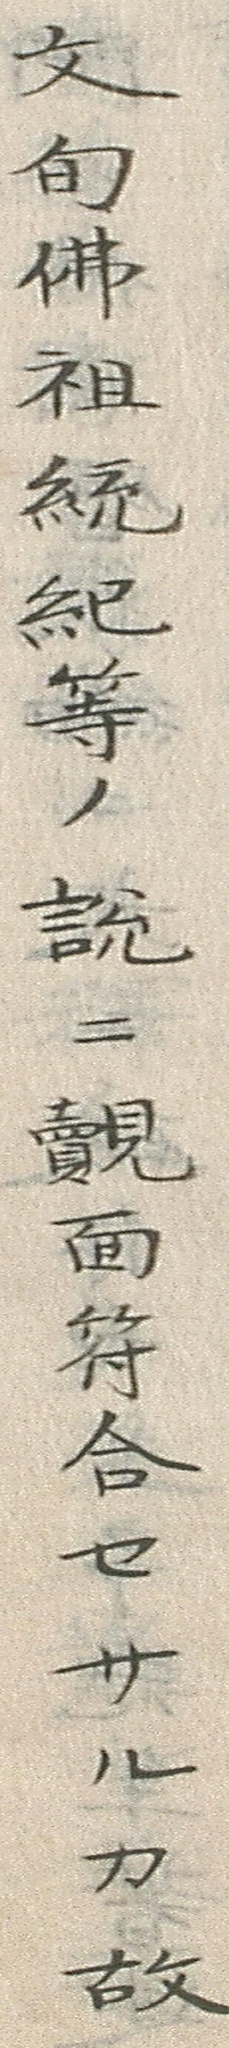文句仏祖統紀等ノ説ニ観面符合セサルカ故
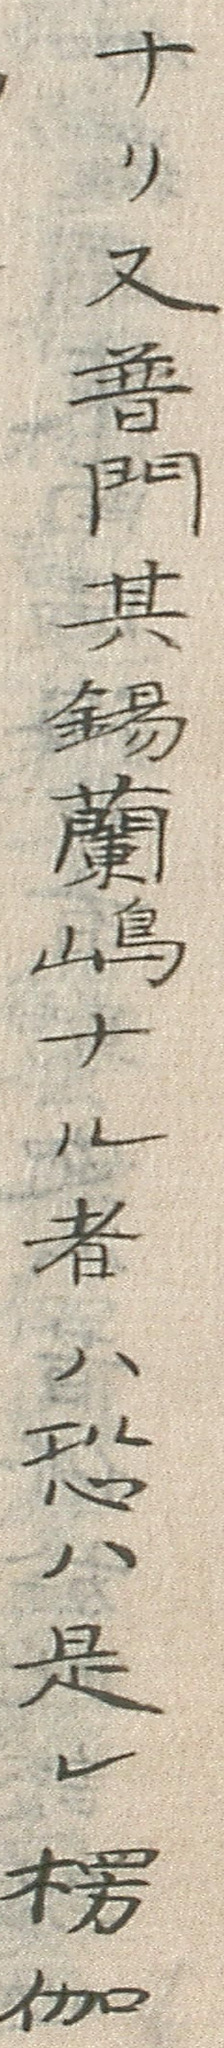ナリ又普門其錫蘭嶋ナル者ハ恐ハ是レ楞伽
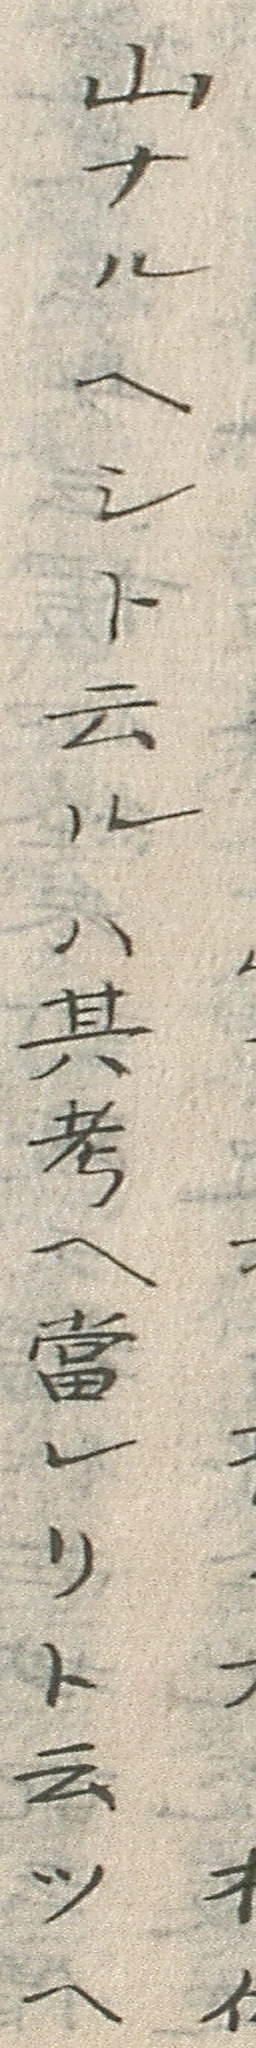山ナルヘシト云ルハ其考ヘ当レリト云ッヘ
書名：天學略名目羽翼　全
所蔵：東京大学地震研究所図書室 Earthquake Research Institute Library, The University of Tokyo, JAPAN
